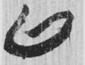㠯（以）
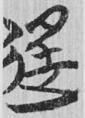○（危）
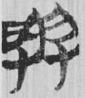與（歟）
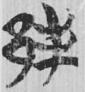邦
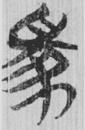家
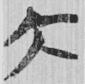大
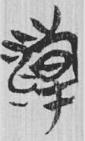○（旱）
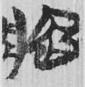○（因）
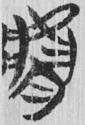○（資）
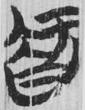智（知）
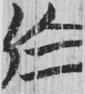於
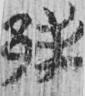邦
